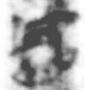○（牙）
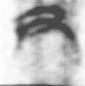尹
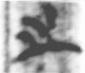之
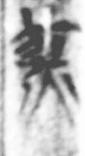黃
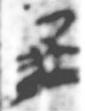爲
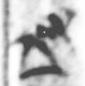○（右）
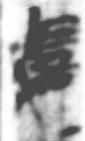驂
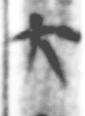大
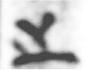之
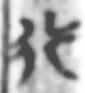行
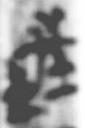○（廣）
